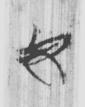母
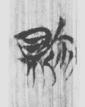則
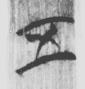五
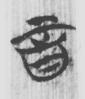音
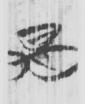是
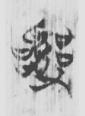𠧏（亂）
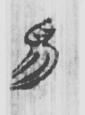易
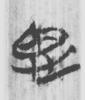思
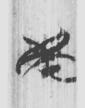民
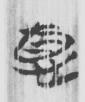惪
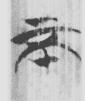不
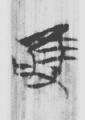{艸隻}
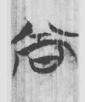尚
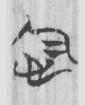念
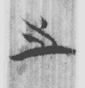之
